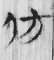仿
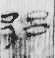郘
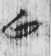㠯（以）
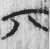亓
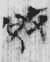敓
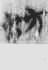汸
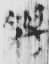與
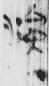澤
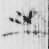之
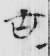古（故）
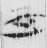正
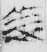義
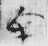牢
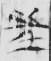往
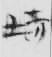坷
